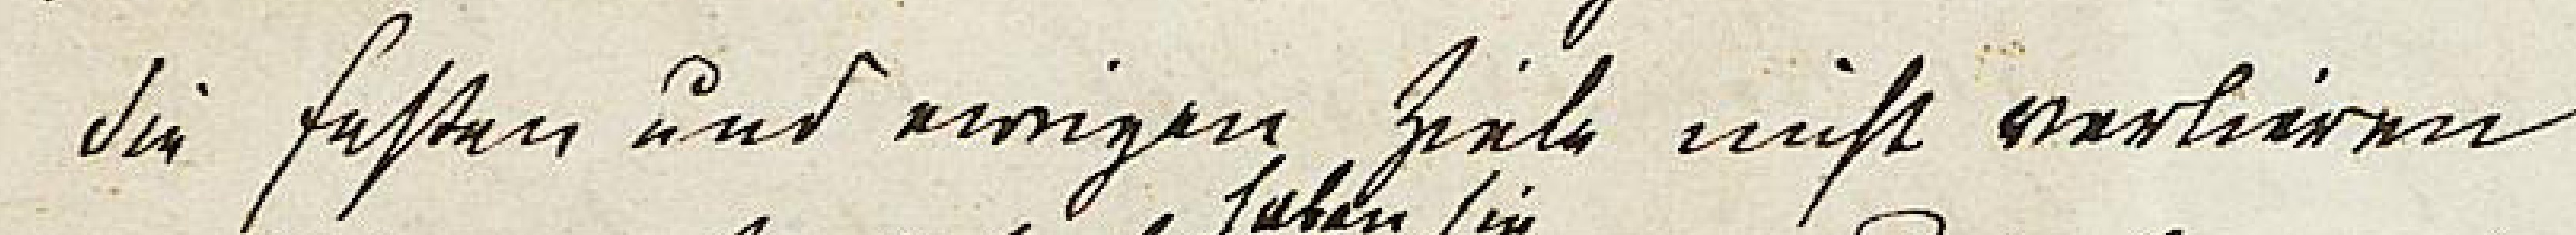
die festen und ewigen Ziele nicht verlieren
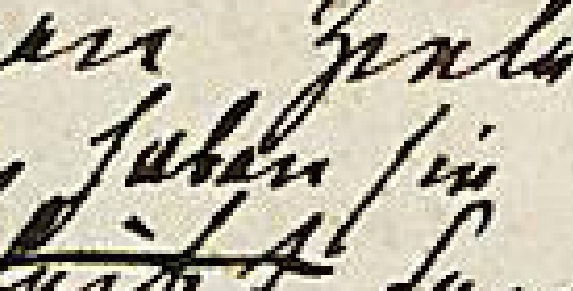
haben sie
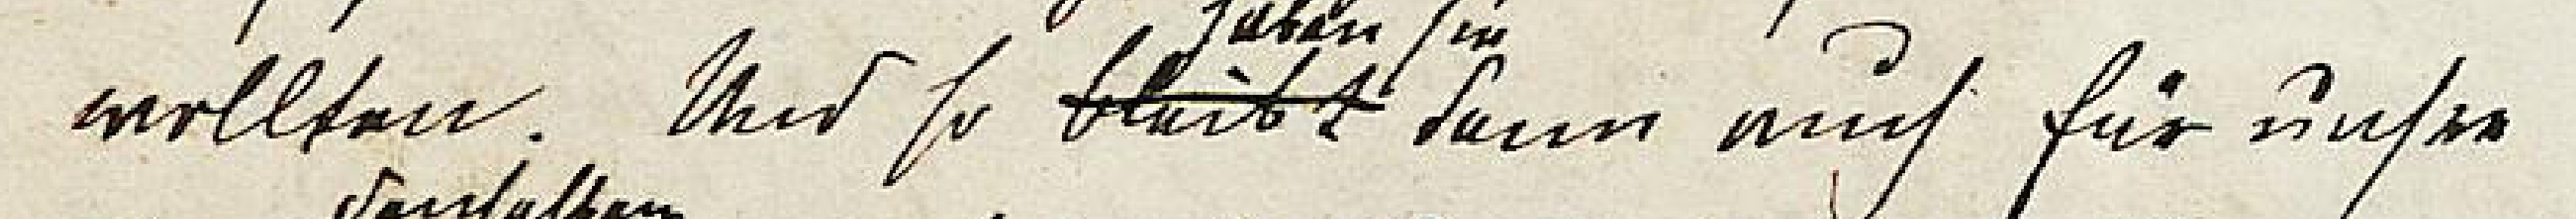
wollten. Und so bleibt denn auch für unsre
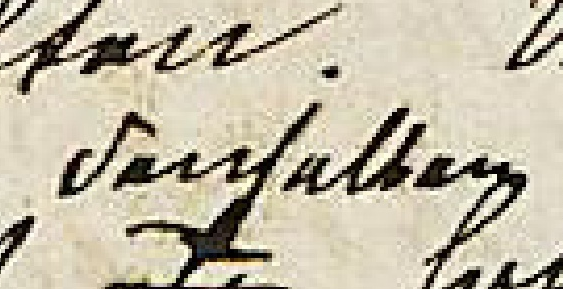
denselben
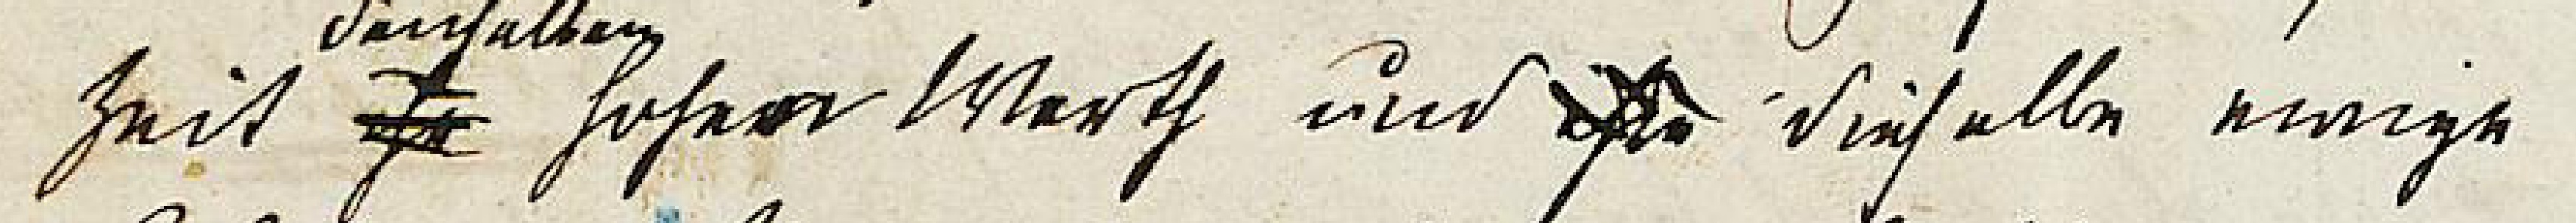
zeit ihr hohern Werth und ihr dieselbe ewige
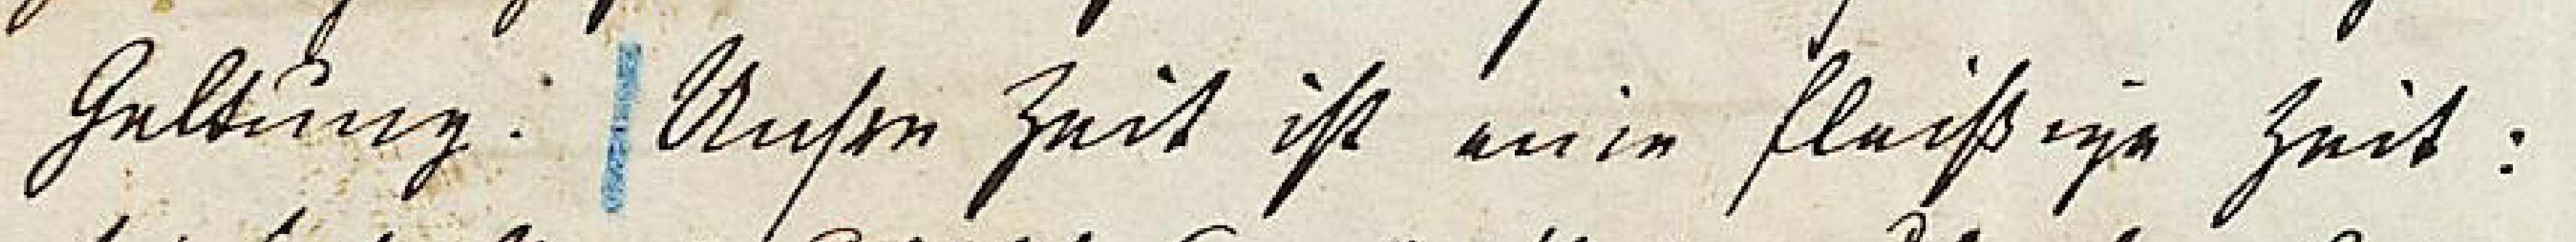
Geltung: | Unsre Zeit ist eine fleißige Zeit:
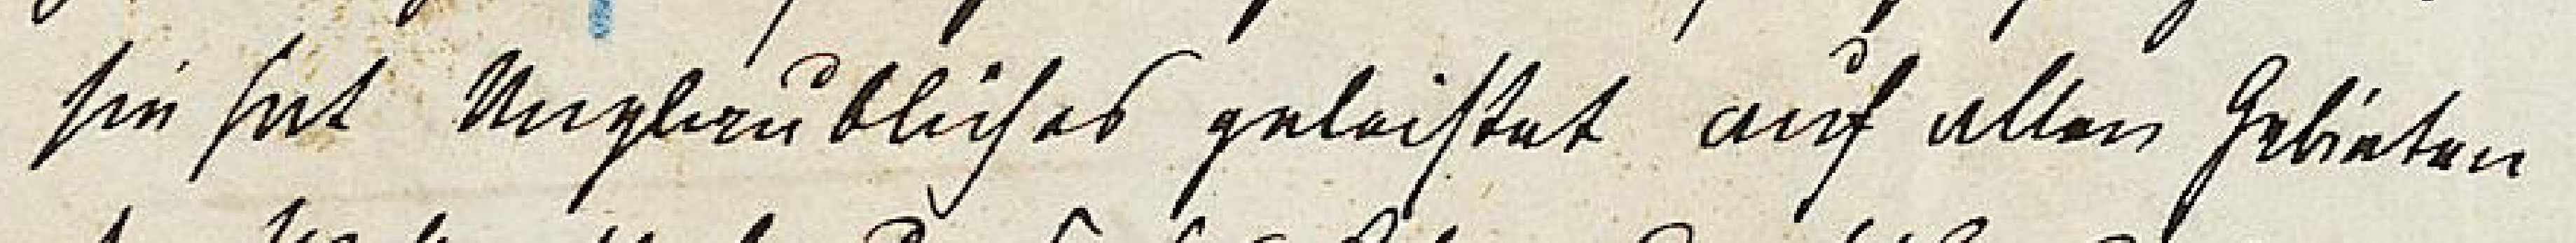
sie hat Unglaubliches geleistet auf allen Gebieten
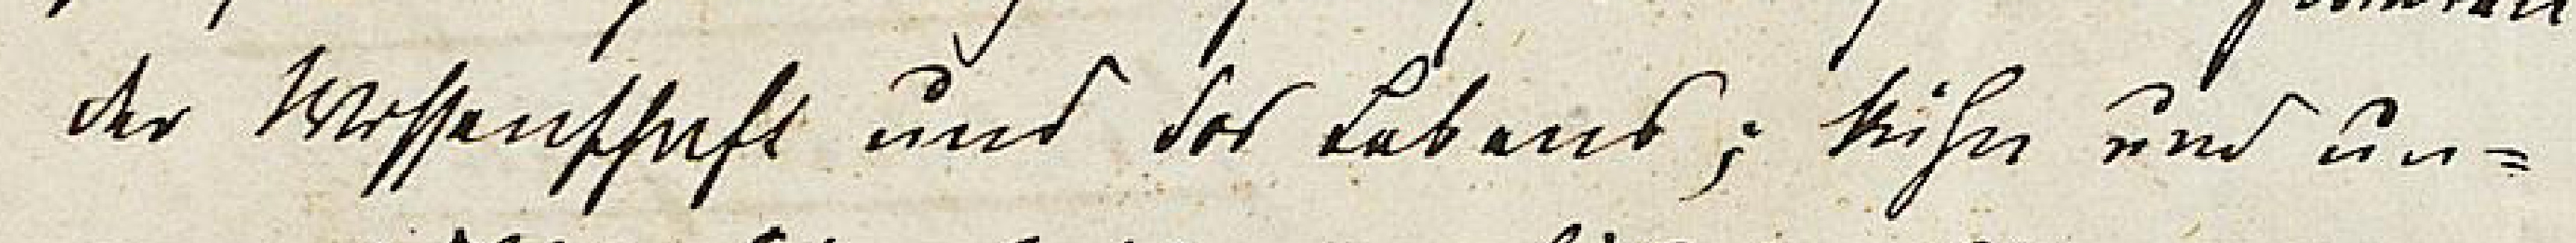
der Wissenschaft und des Lebens; kühn und un¬
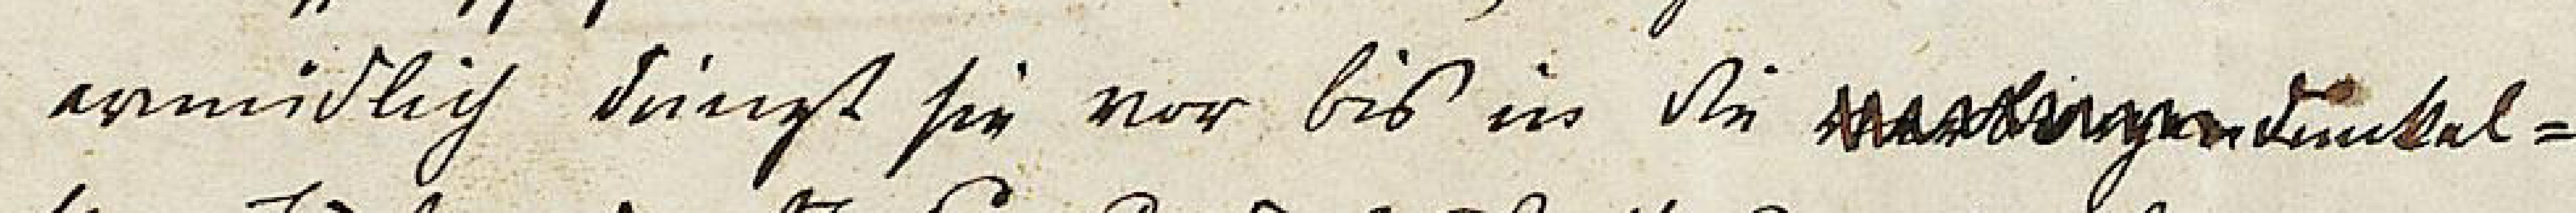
ermüdlich dringt sie vor bis in die verborgen dunkel¬
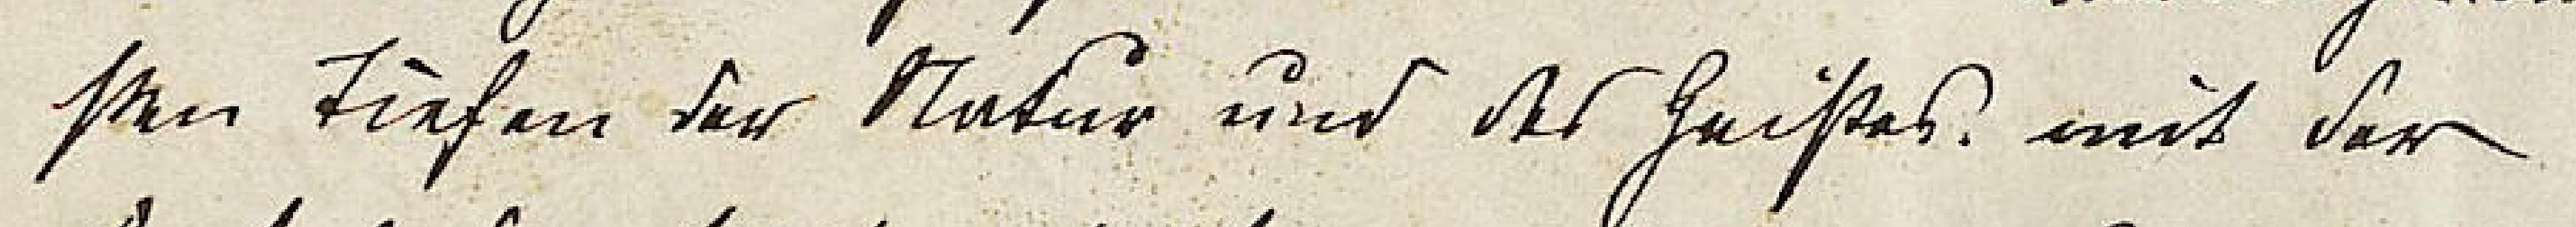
sten Tiefen der Natur und des Geistes mit der
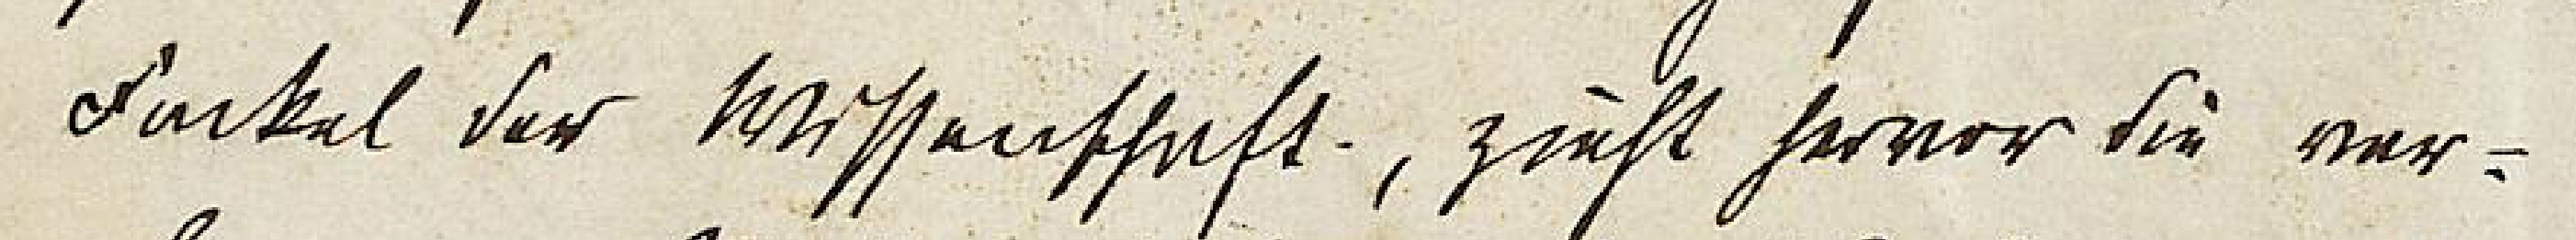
Fakel der Wissenschaft, zieht hervor die ver¬
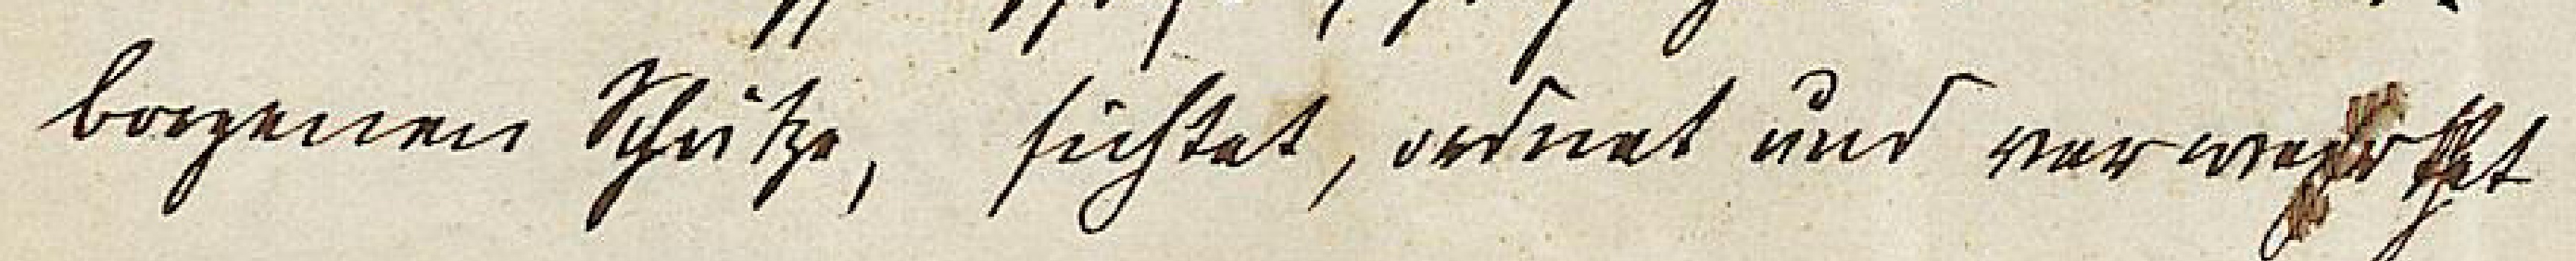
borgenen Schätze, sichtet, ordnet und verwehrthet
